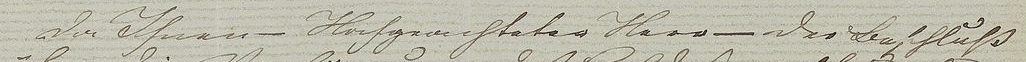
Da Ihnen – Hochgeachteter Herr – der Beschluß
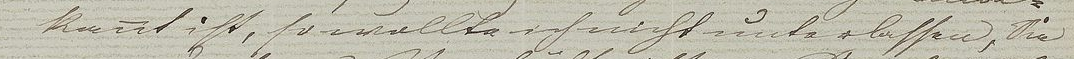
kannt ist, so wollte ich nicht unterlassen, Sie
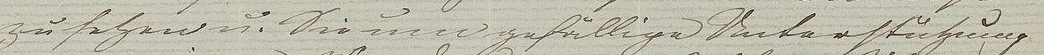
zu setzen u. Sie um gefällige Unterstützung
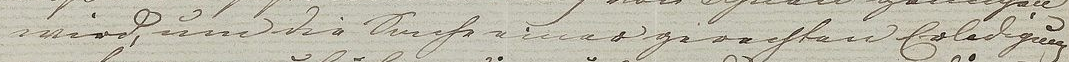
wird, um die Sache einer gerechten Erledigung
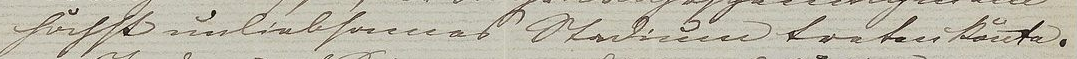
höchst unliebsames Stadium treten könnte.
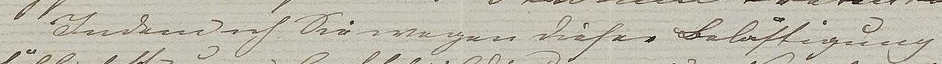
Indem ich Sie wegen dieser Belästigung
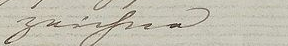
zeichne
